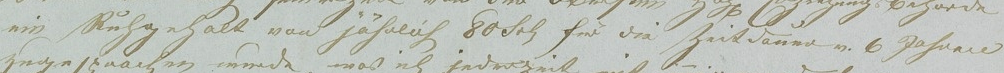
ein Ruhgehalt von jährlich 80 Frk für die Zeitdauer v. 6 Jahren
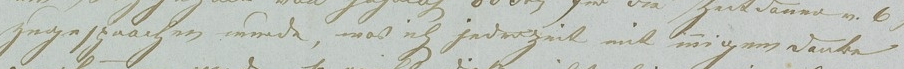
zugesprochen wurde, was ich jederzeit mit innigem Danke
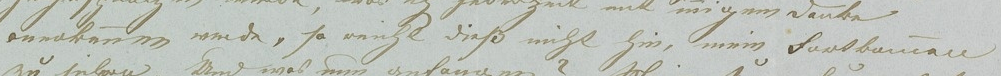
anerkennen werde, so reicht dieß nicht hin, mein Fortkommen
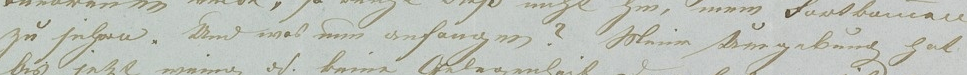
zu sichern. Und was nun anfangen? Meine Umgebung hat
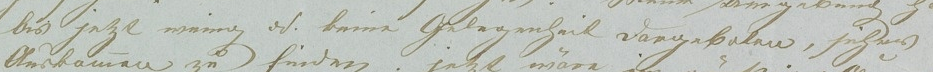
bis jetzt wenig o. keine Gelegenheit dargeboten, sichres
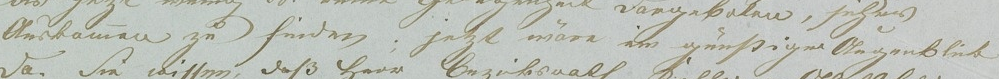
Auskommen zu finden; jetzt wäre ein günstiger Augenblick
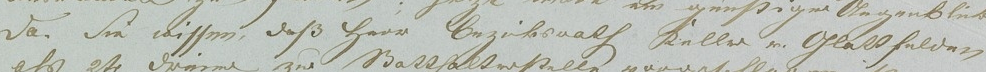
da. Sie wissen, daß Herr Bezirksrath Keller v. Glattfelden
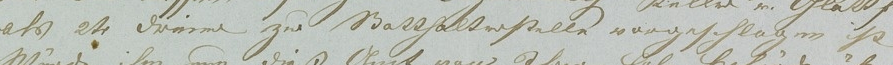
als 2tr Dreier zur Statthalterstelle vorgeschlagen ist.
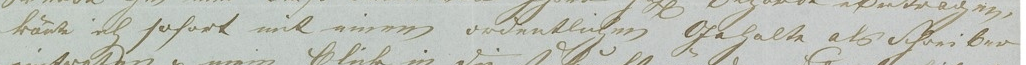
könnte ich sofort mit einem ordentlichen Gehalte als Schreiber
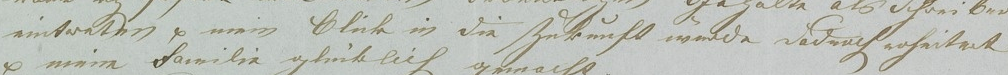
eintreten & mein Blick in die Zukunft würde dadurch erheitert
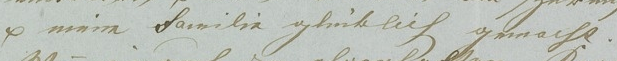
& meine Familie glücklich gemacht.
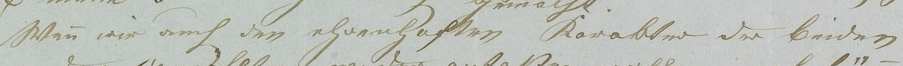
Wenn wir auch den ehrenhaften Karakter der beiden
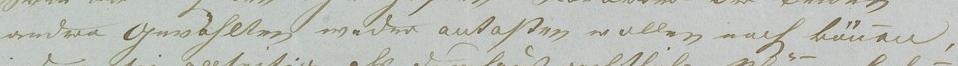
andern Gewählten weder antasten wollen noch können,
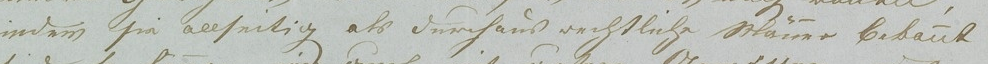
indem sie allseitig als durchaus rechtliche Männer bekannt
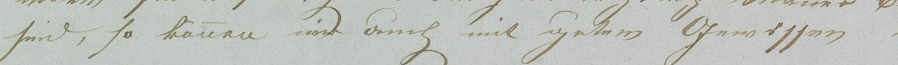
sind, so können wir auch mit gutem Gewissen
